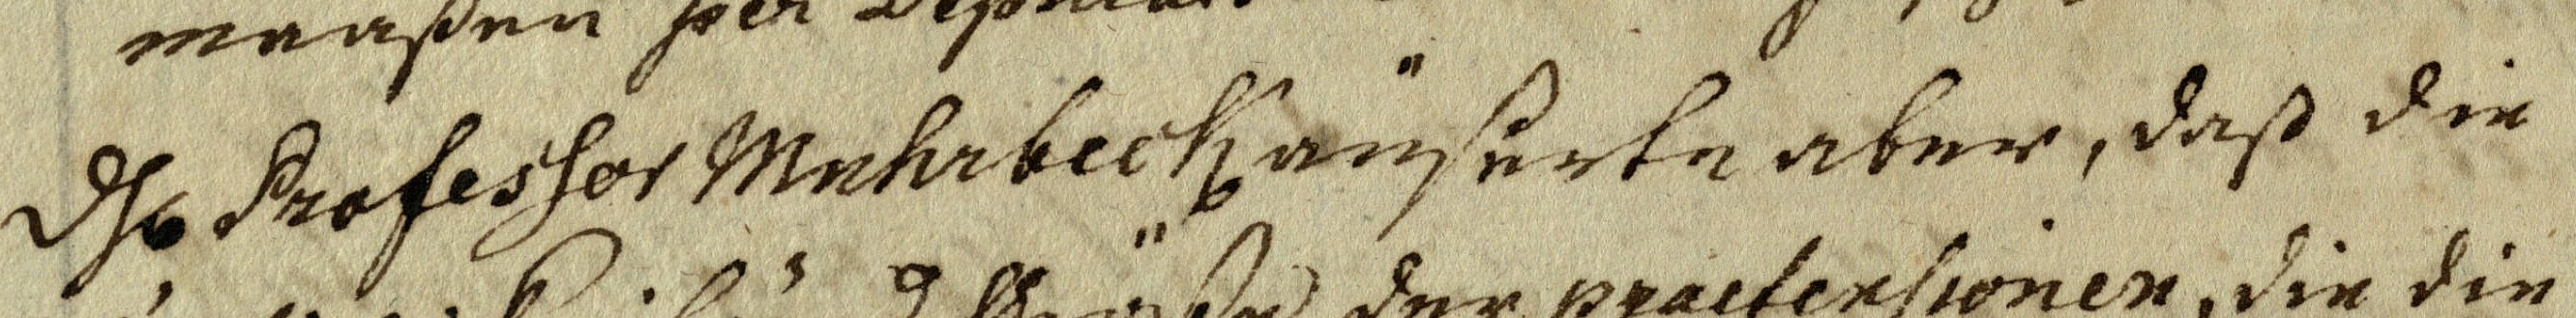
Dh Professor Muhrbeck äußerte aber, daß die
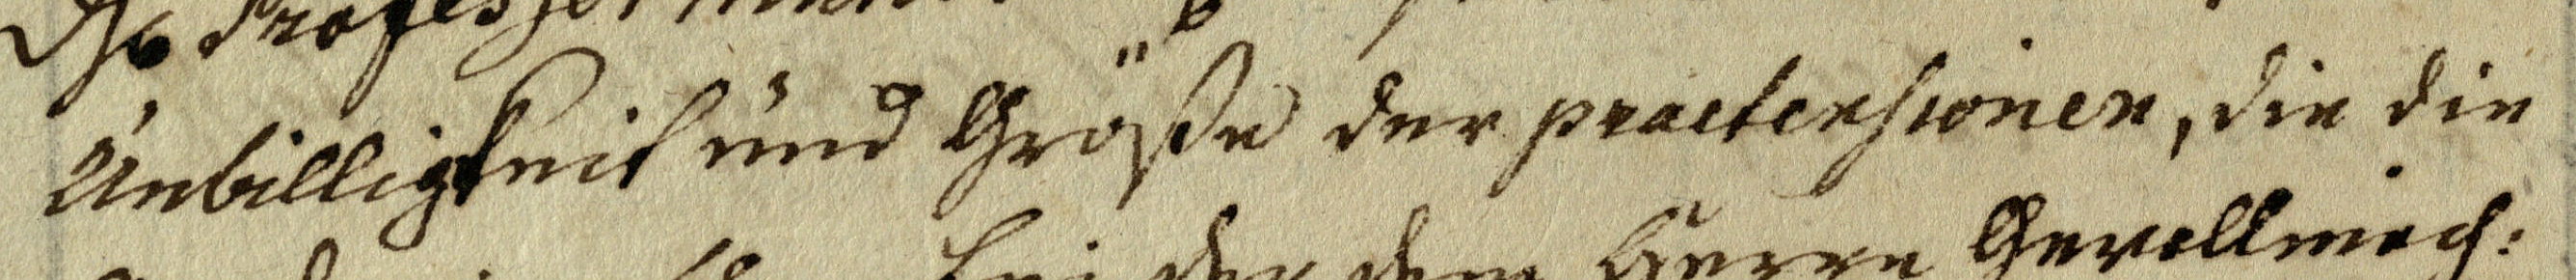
Unbilligkeit und Größe der praetensionen, die die
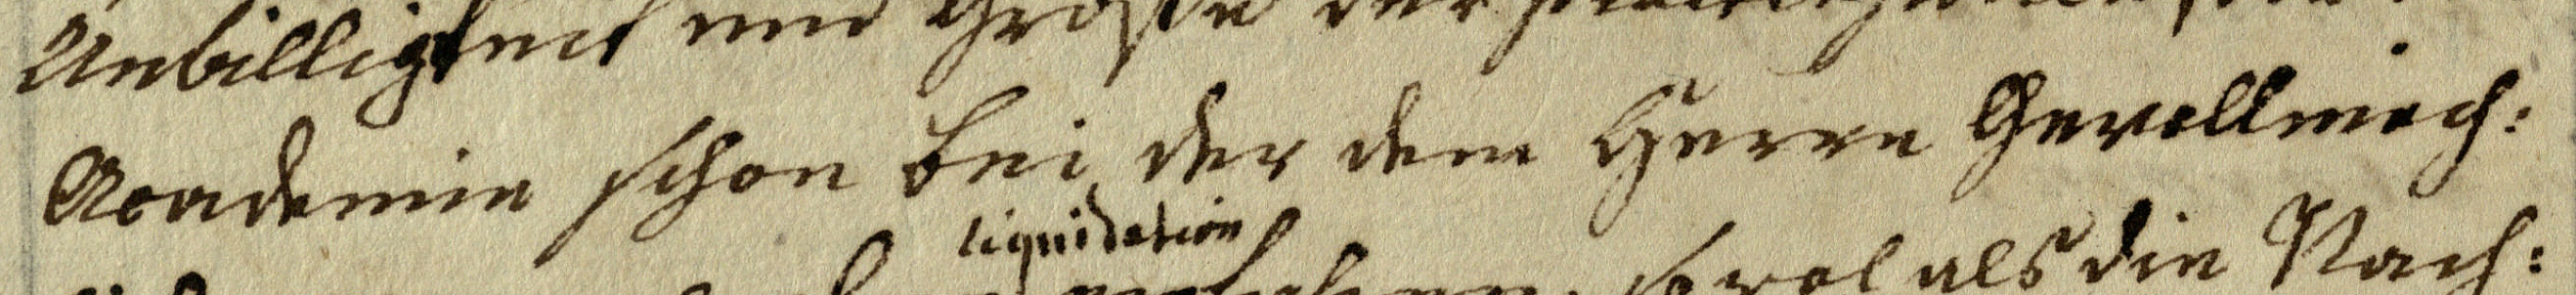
Academie schon bei der dem Herrn Gevollmäch¬
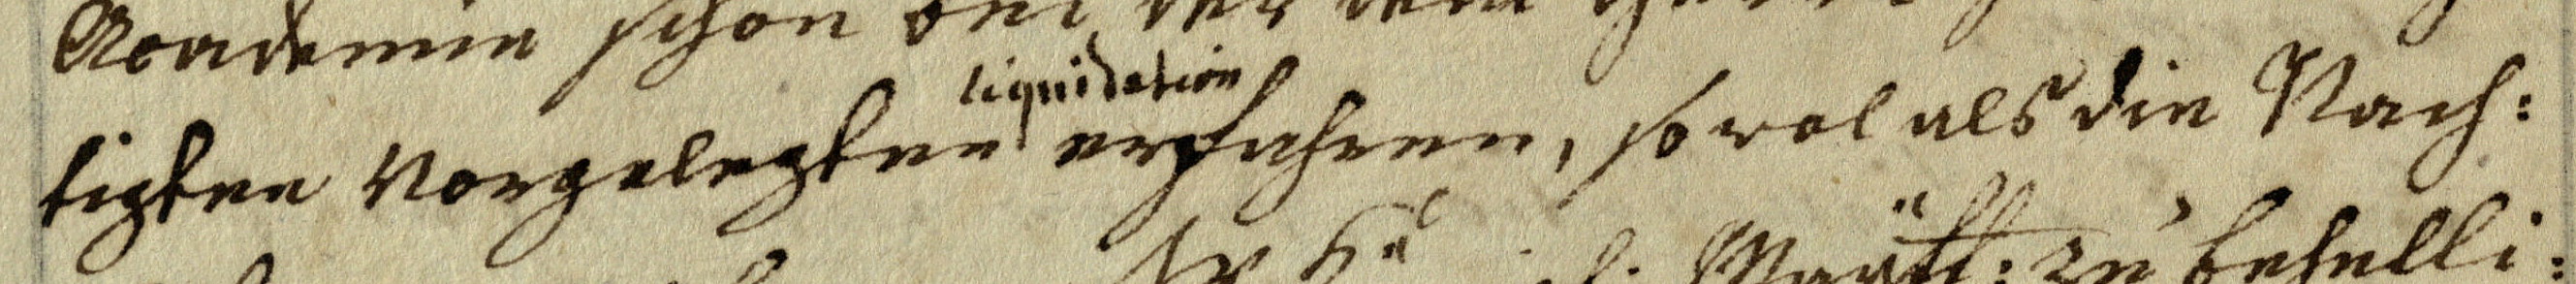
tigten vorgelegten liquidation erfahren, sowol als die Nach¬
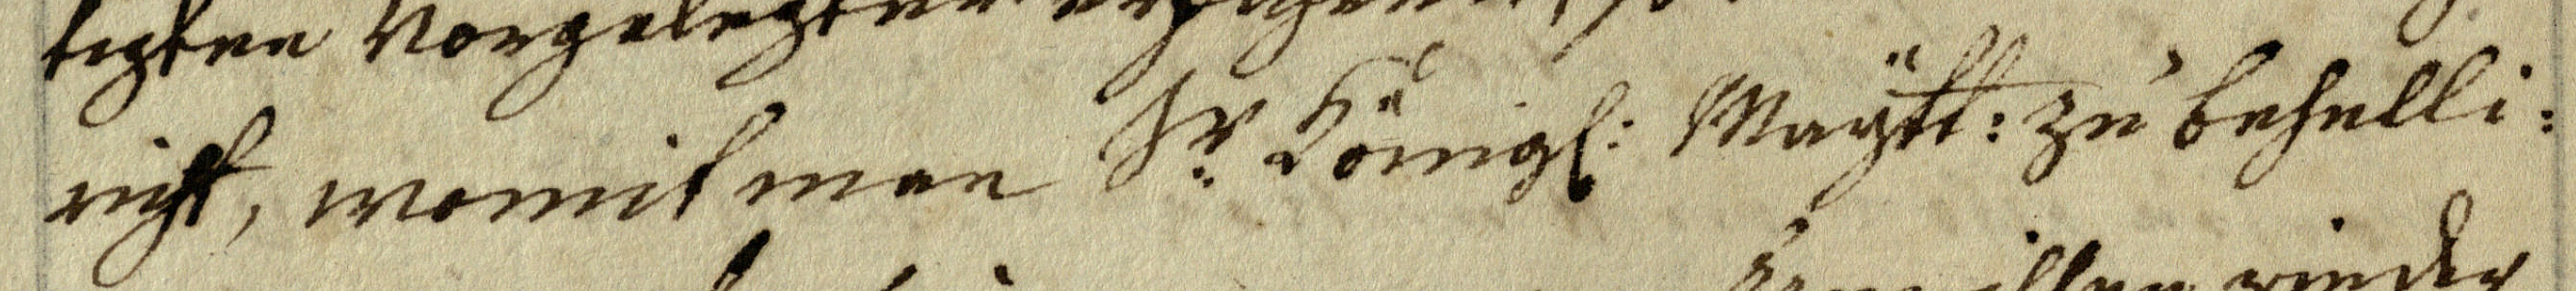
richt, womit man Sr. Königl. Maÿtt. zu behelli¬
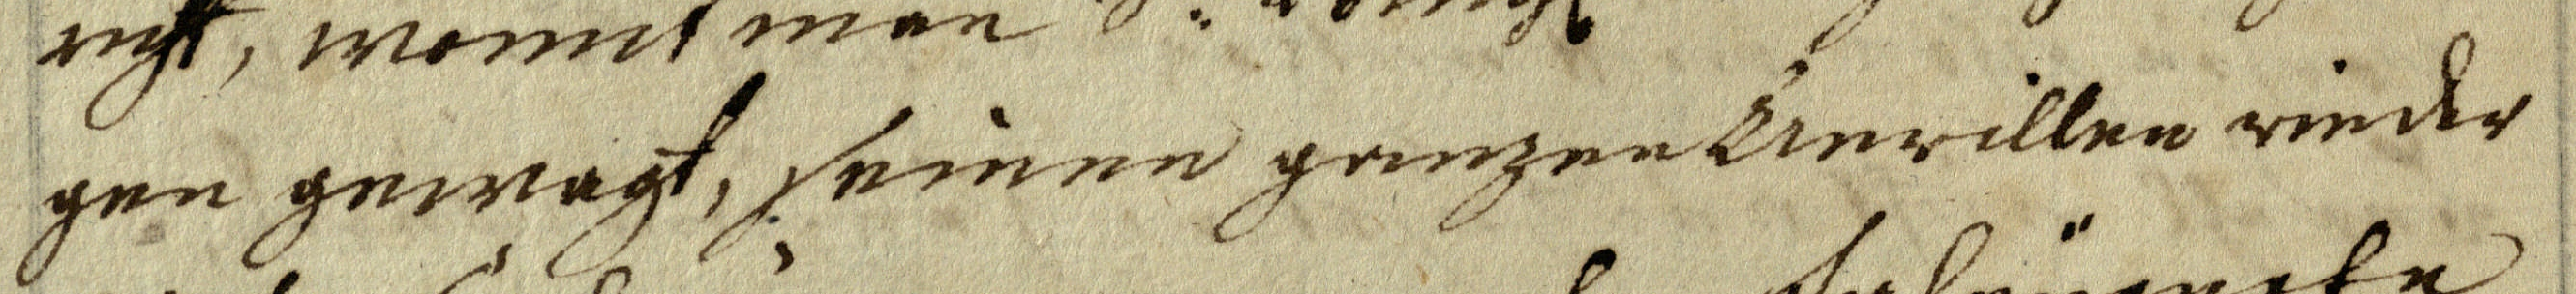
gen gewagt, seinen ganzen Unwillen wieder
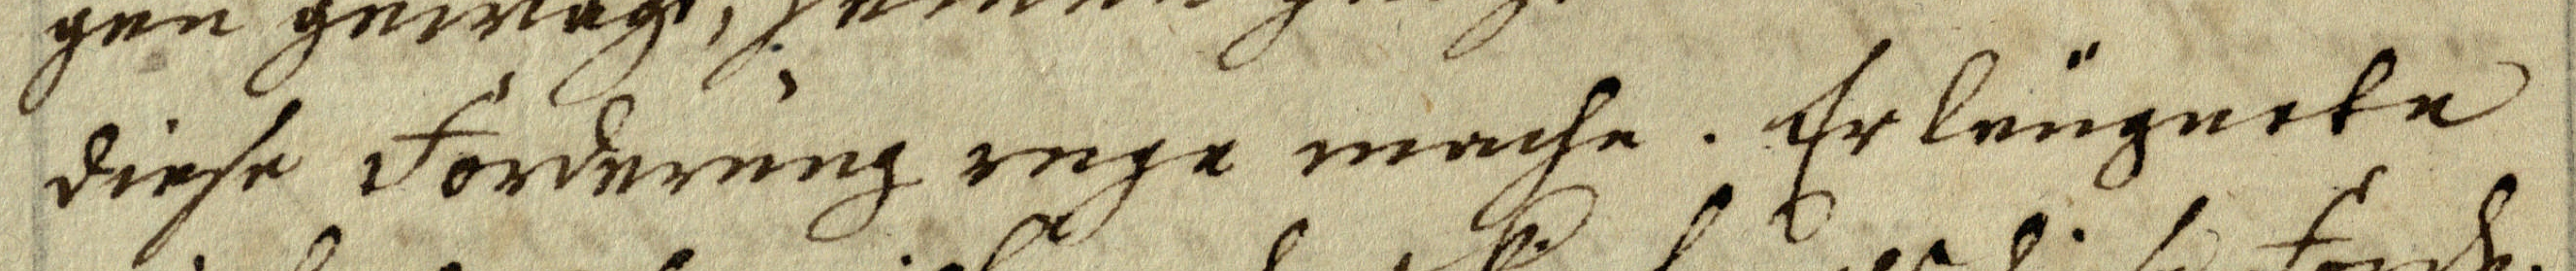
diese Forderung rege mache. Er leugnete
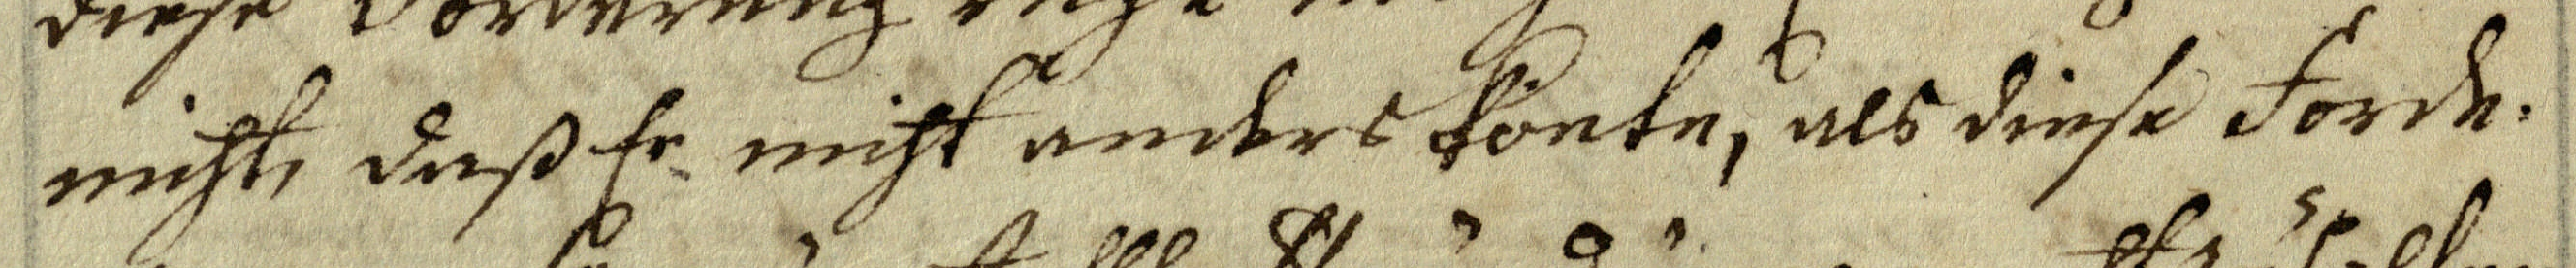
nicht, daß Er nicht anders könte, als diese Forde¬
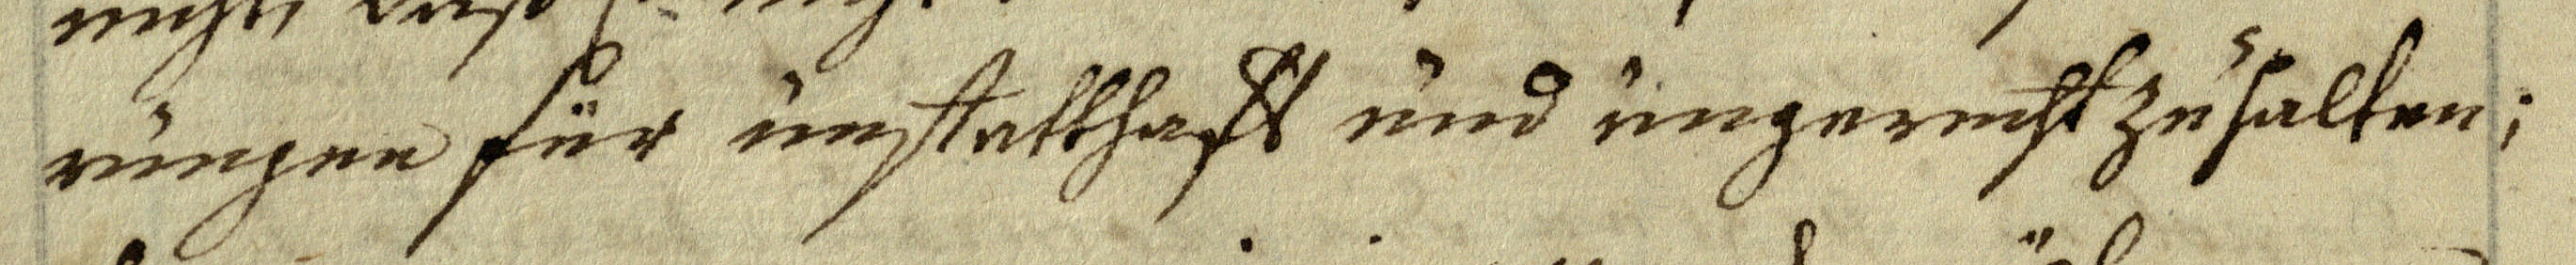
rungen für unstatthaft und ungerecht zu halten;
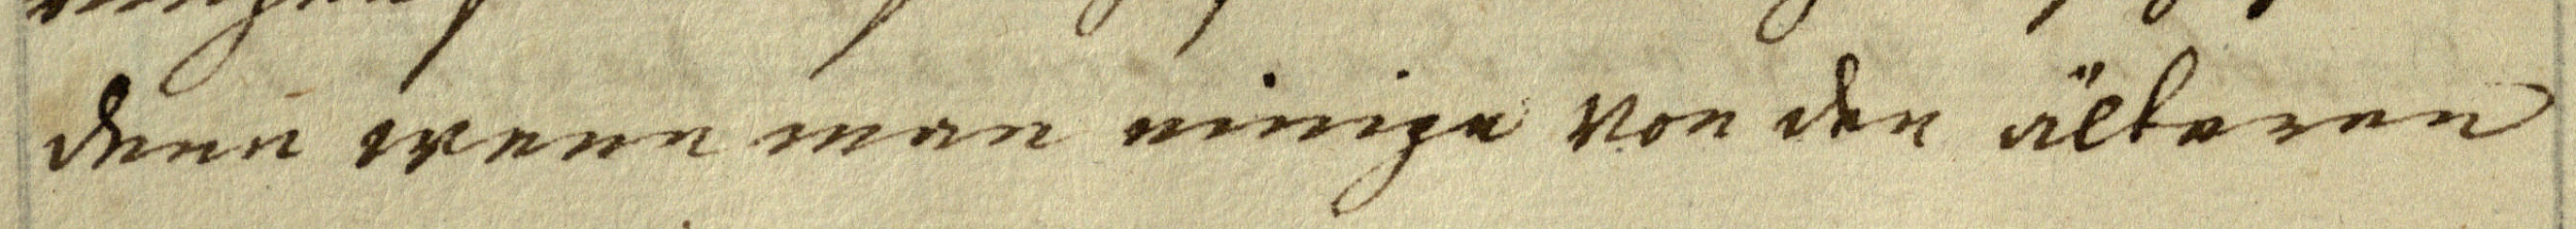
denn wenn man einige von den älteren
